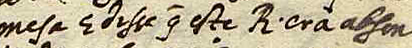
mesa E disse q̄ este R. era absen
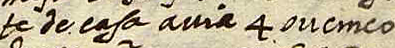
te de casa auia 4 ou cinco
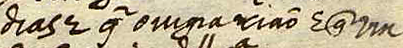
dias E q̄ o uigiariaõ E q̄ vin
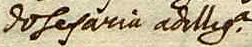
do se faria a dillig.a
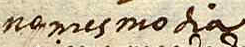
no mesmo dia
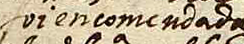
foi encomendada
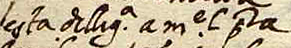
esta dillig.a a m.el pra
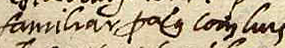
familiar ꝑa q̄ com luis
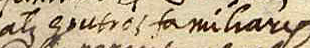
al̄z E outros familiares
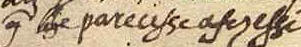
q̄ lhe parecesse a fezessē
